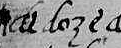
de doze de
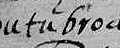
outubro de
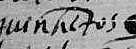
quinhētos e
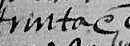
trinta e cī
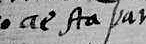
co a esta par
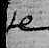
te
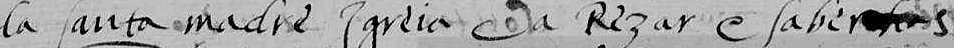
da santa madre Jgreia e a Rezar e saber has
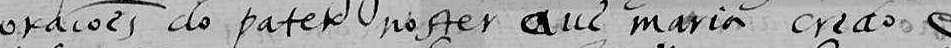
orações do pater noster aue maria credo e
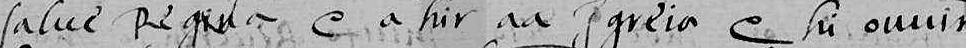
salue Regina e a hir aa Jgreia e hi ouuir
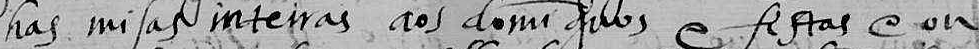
has misas inteiras aos dom̄iguos e festas e ou
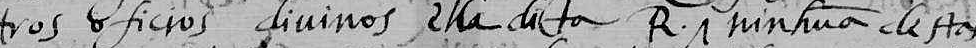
tros oficios diuinos ella dita R. ninhūa destas
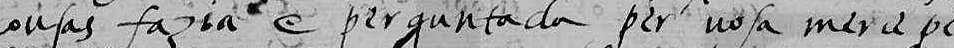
cousas fazia e perguntada per uosa merce pe
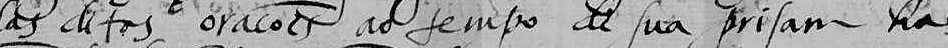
las ditas orações ao tempo de sua prisam has
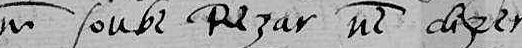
n̄o soube Rezar n̄e dizer
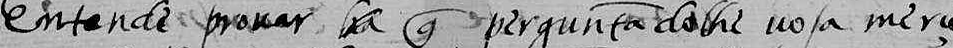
Entende prouar ha q̄ perguntādolhe uosa merce
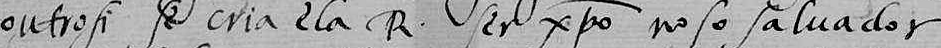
outrosi se cria ela R. ser xp̄o noso saluador
